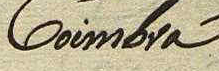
Coimbra
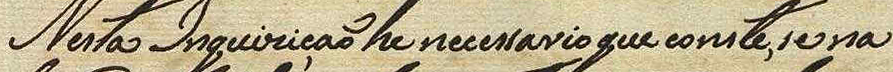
Nesta Inquiziçaõ he necessario que conste, se na
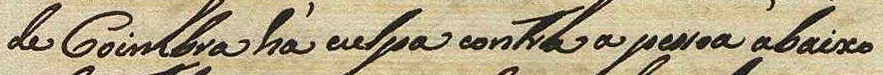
de Coimbra ha culpa contra a pessoa abaixo
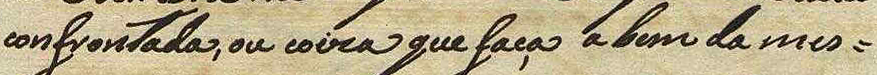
confrontada, ou coiza que faça a bem da mes
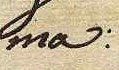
ma:
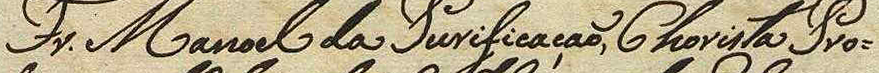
Fr. Manoel da Purificaçaõ, Chorista Pro
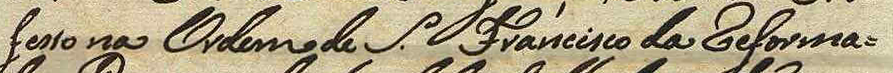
fesso na Ordem de S. Francisco da Reforma
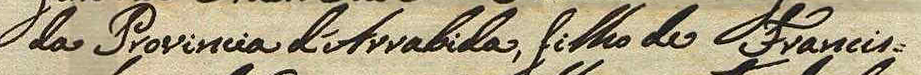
da Provincia d'Arrabida, filho de Francis
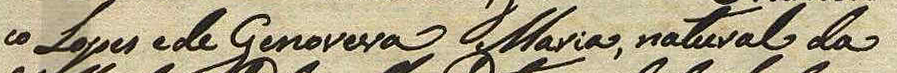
co Lopes e de Genoveva Maria, natural da
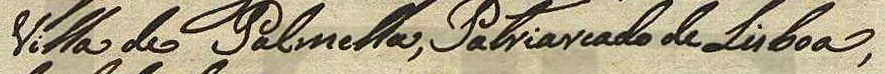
Villa de Palmella, Patriarcado de Lisboa,
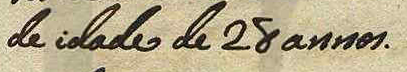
de idade de 28 annos.
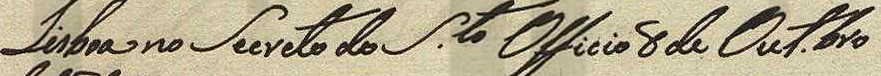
Lisboa no Secreto do S.to Officio 8 de Out.bro
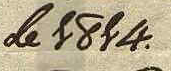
de 1814
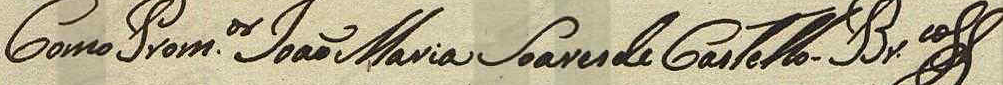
Como Prom.or Ioaõ Maria Soares de Castello Br.co
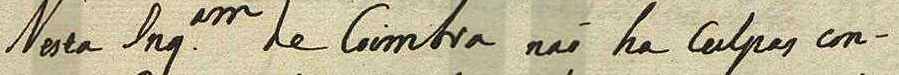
Nesta Inq.am de Coimbra naõ ha culpas con
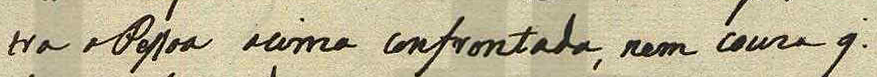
tra a Pessoa acima confrontada, nem couza q̄
